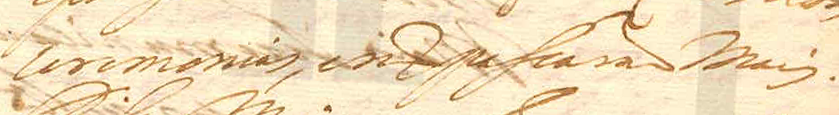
Ceremonias, e naõ passaraõ mais
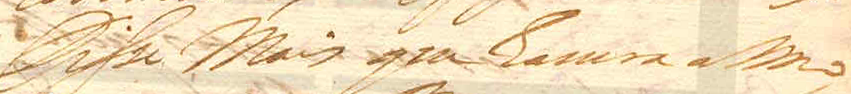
Disse Mais que hauera anno
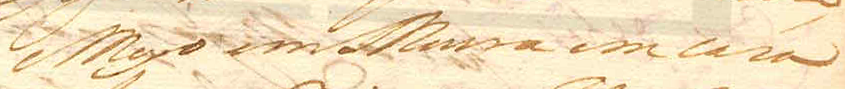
e Meyo em Moura em caza
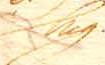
Lug.
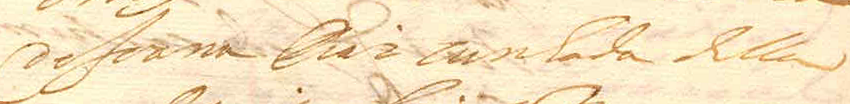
de Joana Diaz cunhada della
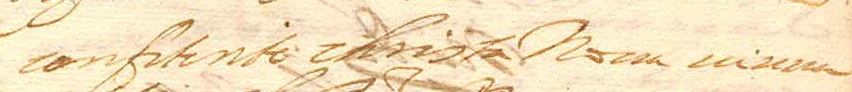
confitente christa Noua uiuua
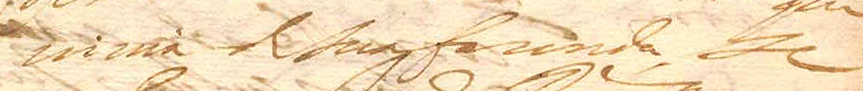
uiuia d sua fazenda, se
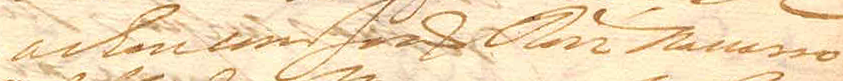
achou com Joaõ Roiz̄ Nauarro
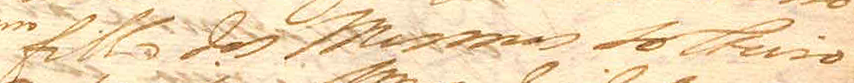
filho dos mesmos solteiro
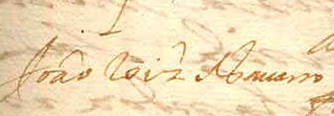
Joaõ Roiz̄ Nauarro
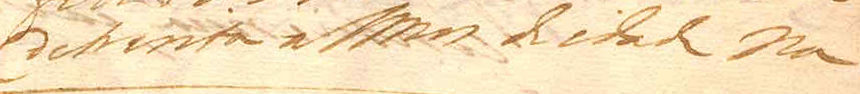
de trinta annos de idade na
